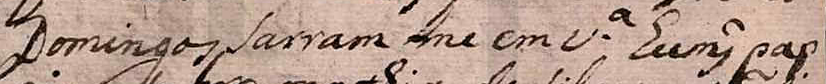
Domingos Sarram me emv.a huns pap
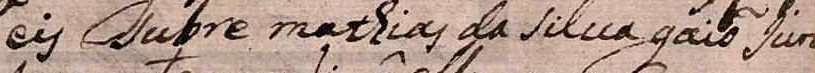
eis subre mathias da Silua gaio Jun
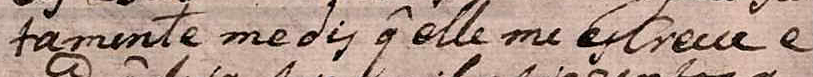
tamente me dis q̄ elle me esCreue e
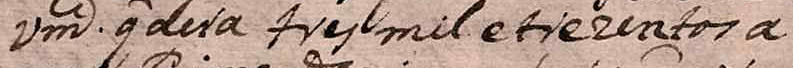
vm.ce q̄ dera tres mil e trezentos a
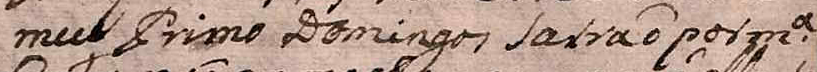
meu Primo Domingos sarraõ por m.a
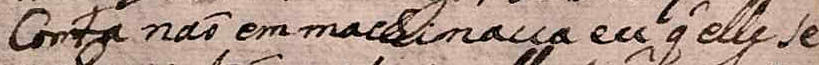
Conta naõ emmachinaua eu q̄ elle se
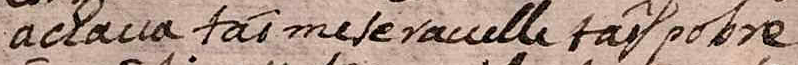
achaua taõ meserauell e taõ pobre
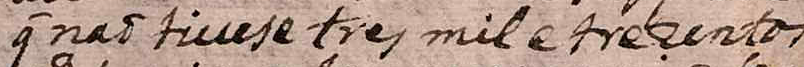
q̄ naõ tiuese tres mil e trezentos
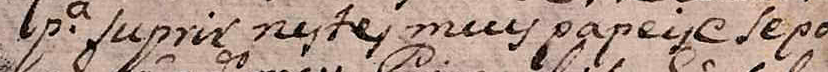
p.a suprir nestes meus papeis e sepo
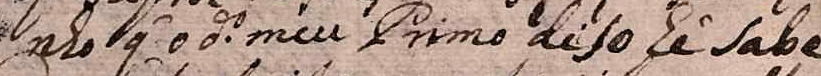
nho q̄ o d.o meu Primo diso hé sabe
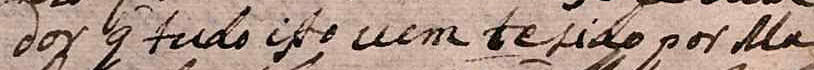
dor q̄ tudo isto uem tesido por Ma
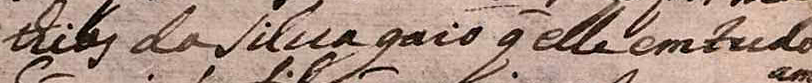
thias da Silua gaio q̄ elle em tudo
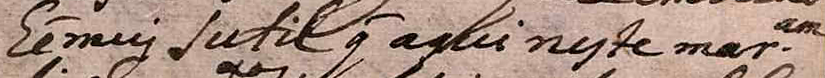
hé muj sutil q̄ aqui neste mar.am
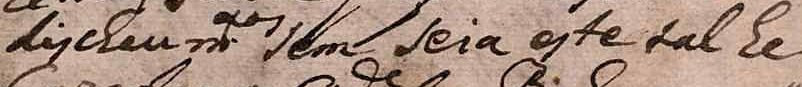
discheu m.tos sem seia este tal he
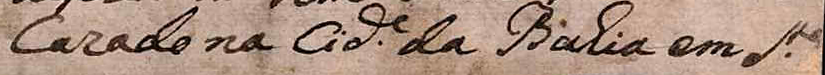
Cazado na Cid.e da Bahia em S.to
